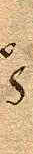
5o
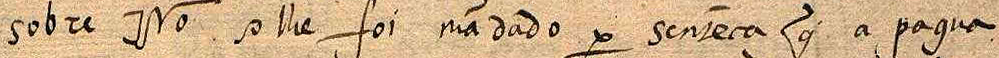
sobre Jsso e lhe foi mādado ꝑ sentēça q̄ a pagua
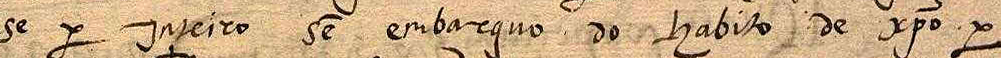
se ꝑ Jnteiro sē embarguo do habito de xpō ꝑ
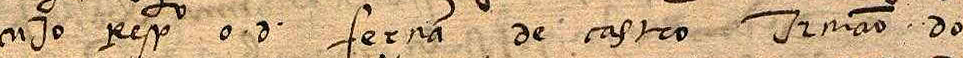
cuJo Respto o d. fernā de castro Jrmão do
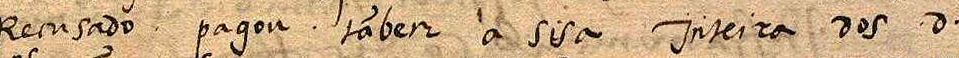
Recusado pagou tābem a sisa Jnteira dos d.
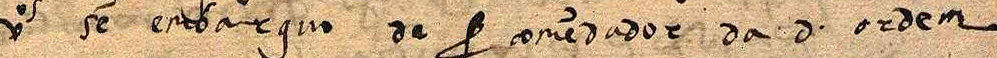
vos sē embarguo de ꞩ comēdador da d. ordem
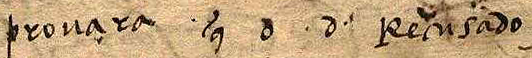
prouara q̄ o d. Recusado
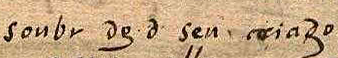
soube do d. seu criado
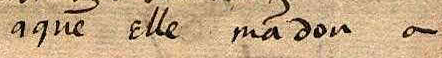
a que Elle mādou a
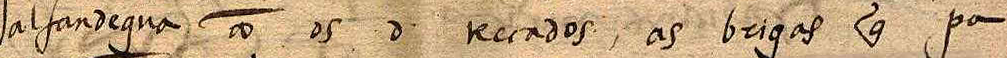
alfandegua c̄o os d. Recados, as brigas q̄ pa
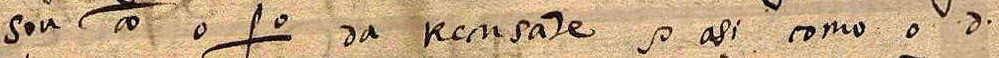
sou cō o fo da Recusāte e asi como o d.
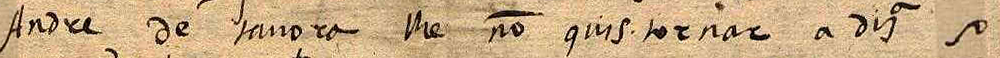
Andre de tauora lhe n̄o quis tornar a diza e
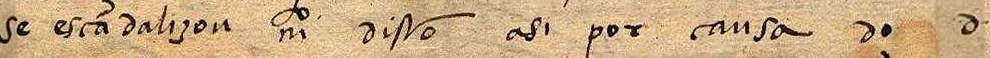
se escādalizou mto disso asi por causa do d.
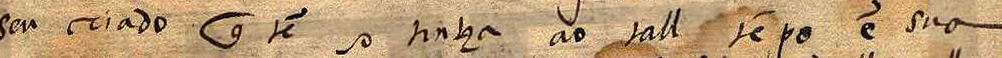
seu criado q̄ tē e tinha ao tall tēpo ē sua
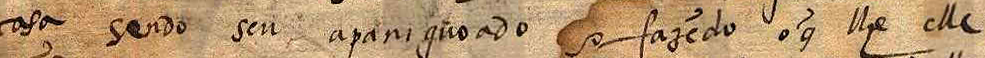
casa sendo seu apaniguoado e fazēdo o q̄ lhe elle
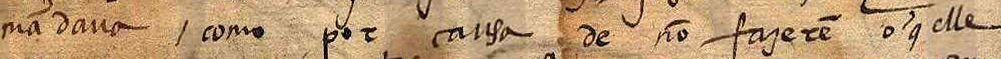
mādaua / como por causa de nō fazerē o q̄ elle
